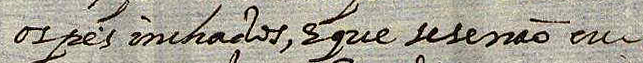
os pes inchados, E que se senão cu
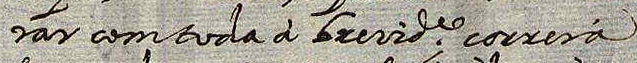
rar com toda a brevid.e, correrá
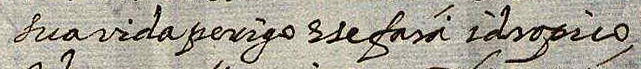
sua vida perigo e se fará idropico,
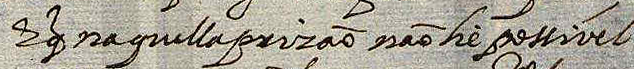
E q̄ naquella prizaõ naõ hè possivel
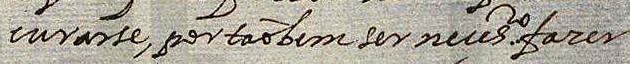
curarse, por taõbem ser neces.ro fazer
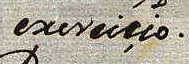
exercicio.
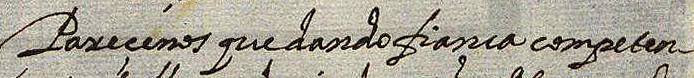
Parecenos que dando fiança competen
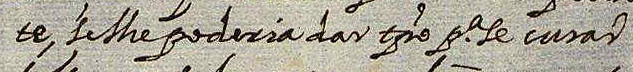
te, se lhe poderia dar tp̄o p.a se curar
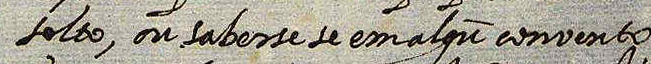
solto, ou saberse se em algū convento
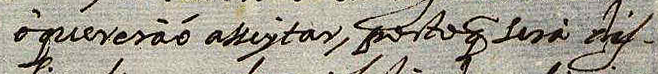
o quereráõ asseytar, posto q̄ será dif
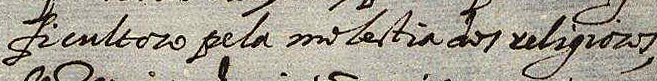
ficultozo pela molestia dos religiozos,
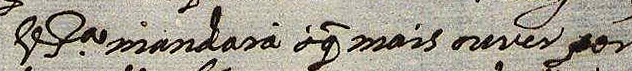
V s.ra mandará o q̄ mais ouver por
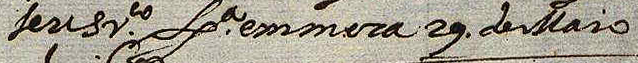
seu sr.ço Lx.a em meza 29. de Maio
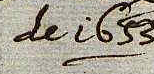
de i653.
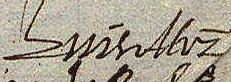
Luis Alvz̄
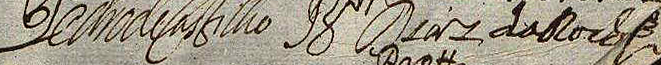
Pedro de Castilho Bar Diaz da Rocha
